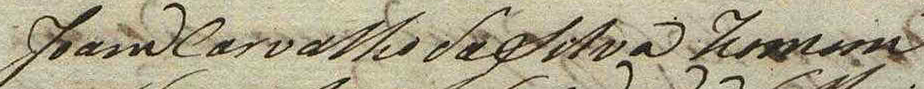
Joam Carvalho da Silva homem
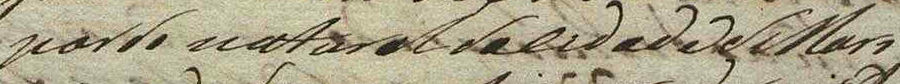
pardo natural da cidade de Mari
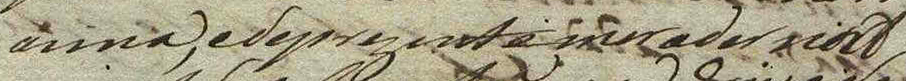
anna, e de prezente morador no A
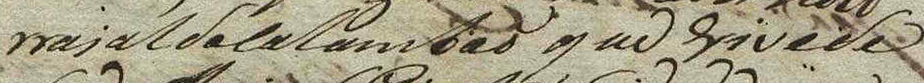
rraial do calambaõ que vive de
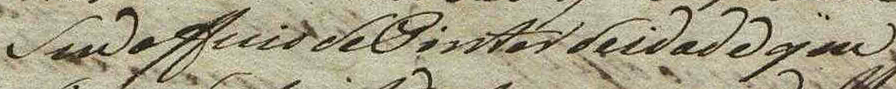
Seu officio de Pintor de idade que
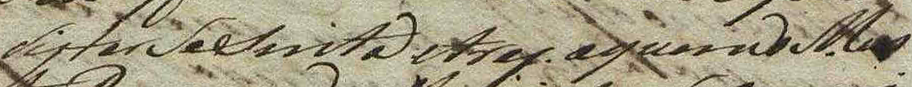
dis ter sesenta e tres a quem o Mui
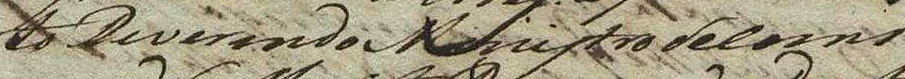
to Reverendo Menistro de comis
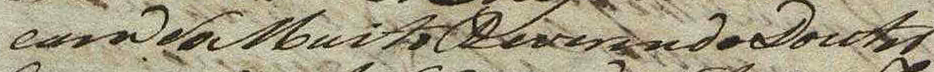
cam do Muito Reverendo Doutor
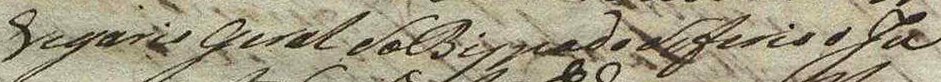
Vigario Geral do Bispado deferio o Ju
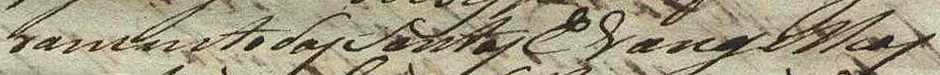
ramento dos Santos EVangelhos
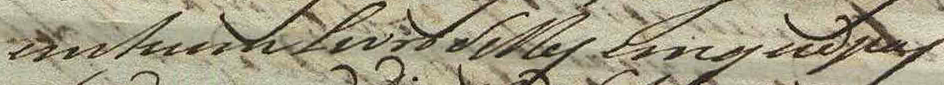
em hum Livro delles em que pos
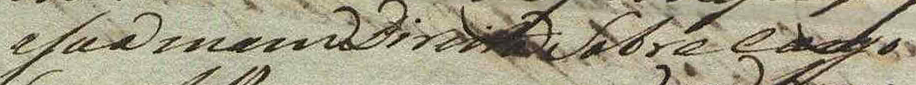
a sua mam Direira sobre cargo
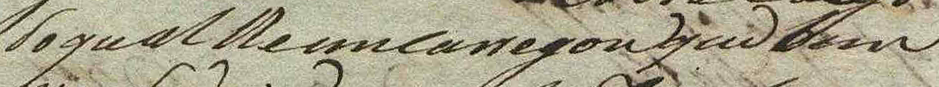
do qual lhe emcarregou que bem
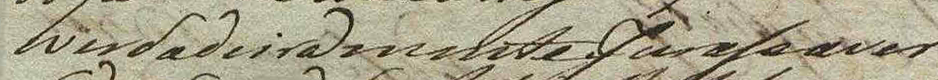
e verdadeiramente Jurase a ver
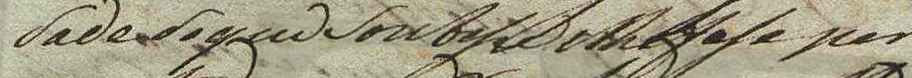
dade do que soubesse e lhe fose per
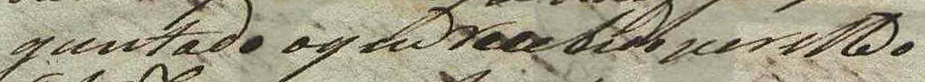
guntado o que recebido per elle o
